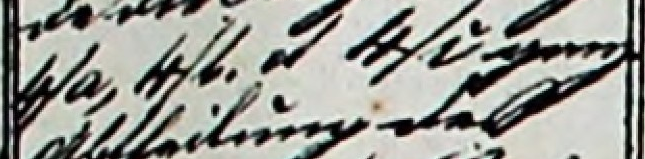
4/a, 4/b et 4/c ganz
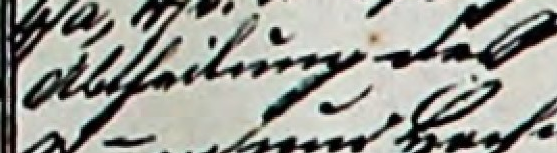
Abtheilung des
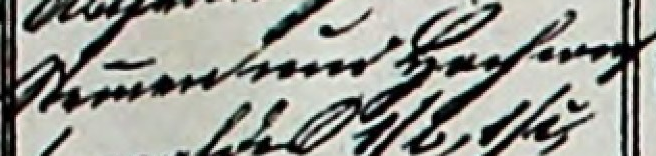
Stemmen und Hochwas„
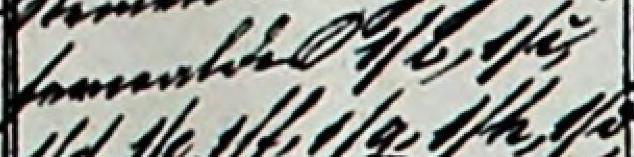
serwaldes 1/b, 1/c,
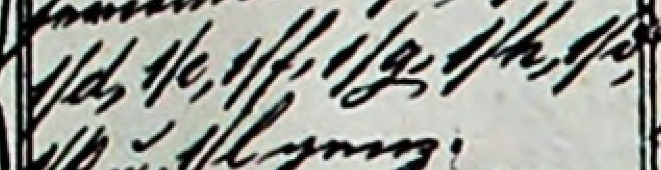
1/d, 1/e, 1/f, 1/g, 1/h, 1/j,
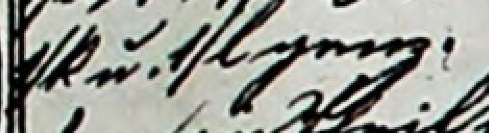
1/k u. 1/l ganz.
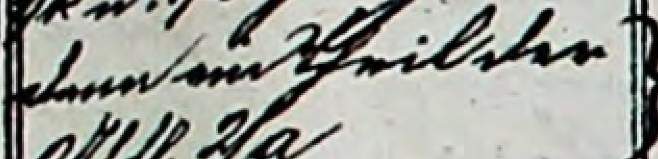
denn im Theil der
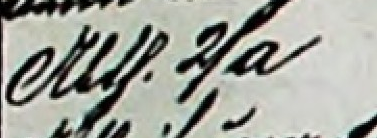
Abth. 2/a
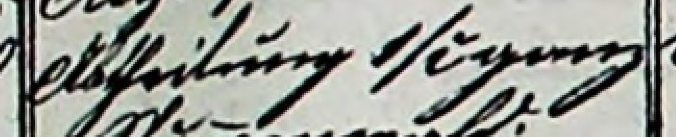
Abtheilung 1/c ganz
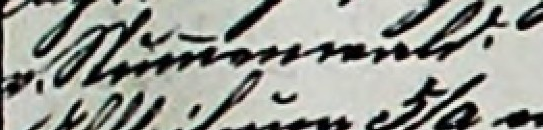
v. Stummenwald.
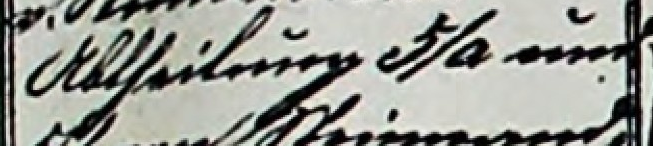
Abtheilung 5/a und
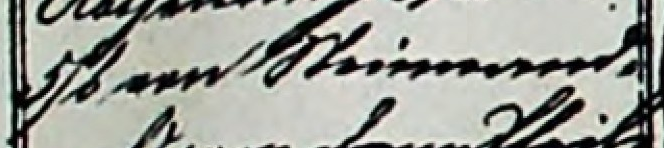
5/b von Steinwand„
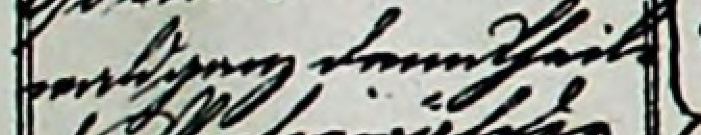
waldganz denn Theile
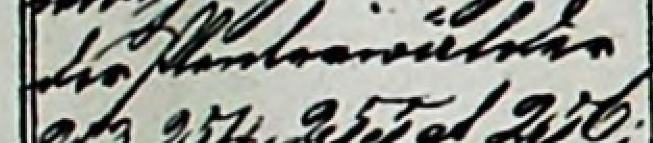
der Plenterwälder
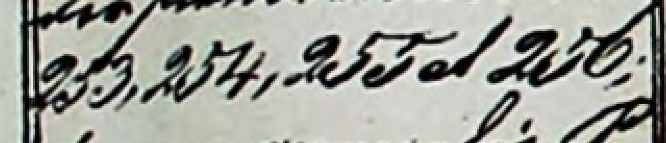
253, 254, 255 et 256;
